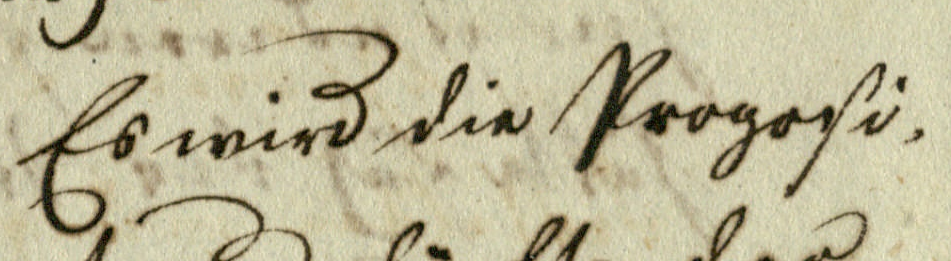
Es wird die Proposi¬
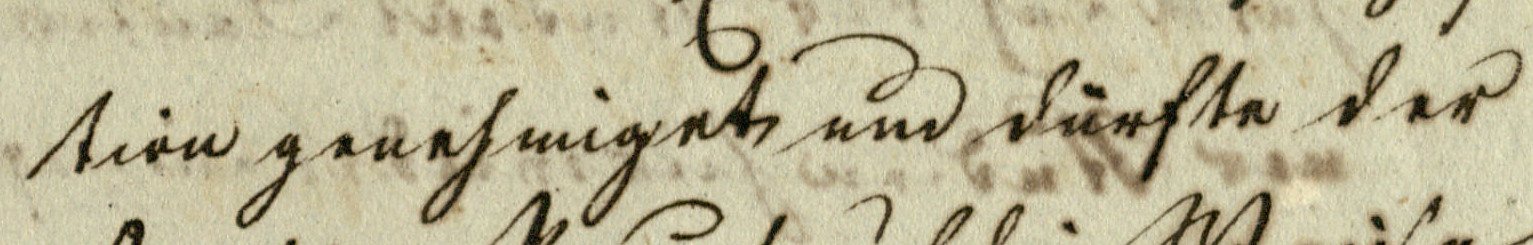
tion genehmiget und dürfte der
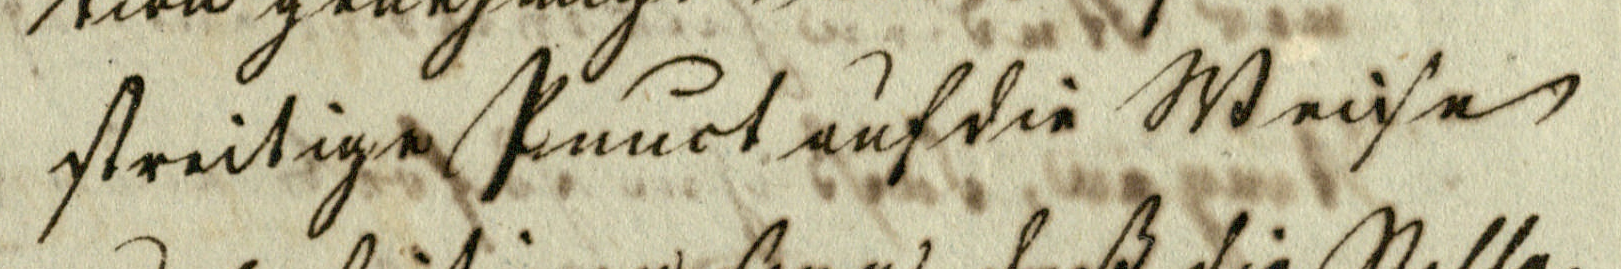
streitige Punct auf die Weise
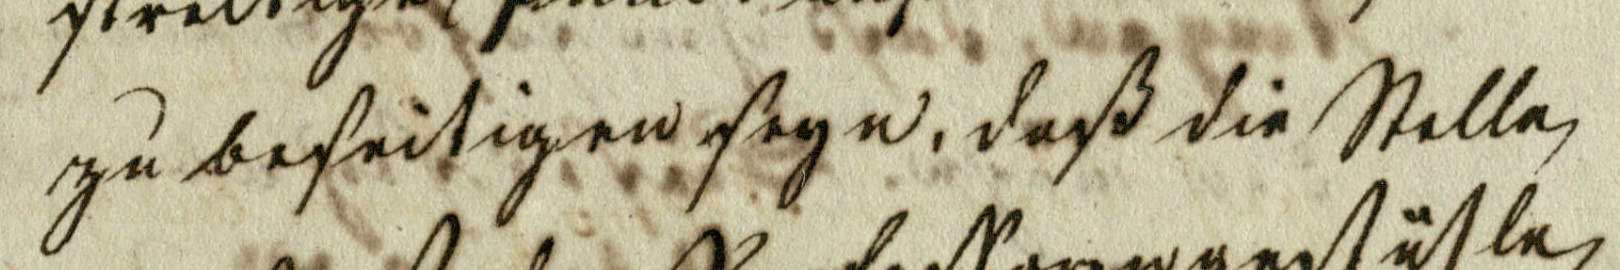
zu beseitigen seyn, daß die Stelle,
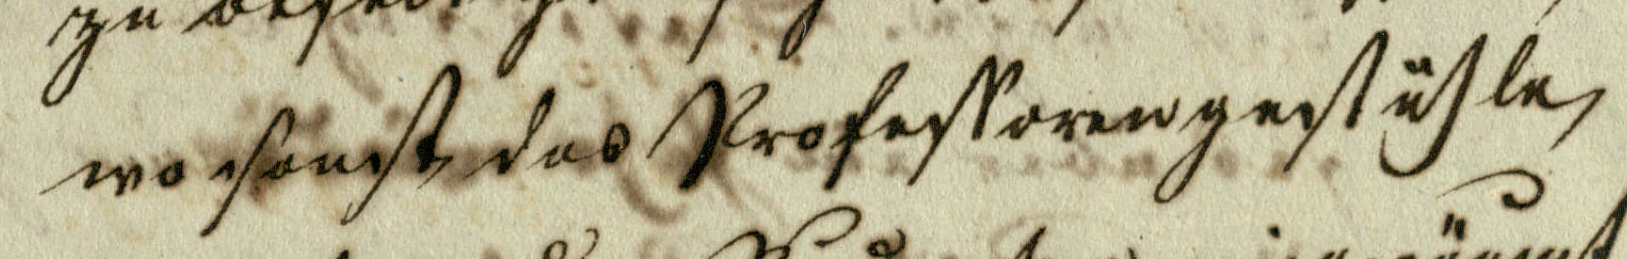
wo sonst das Professorengestühle,
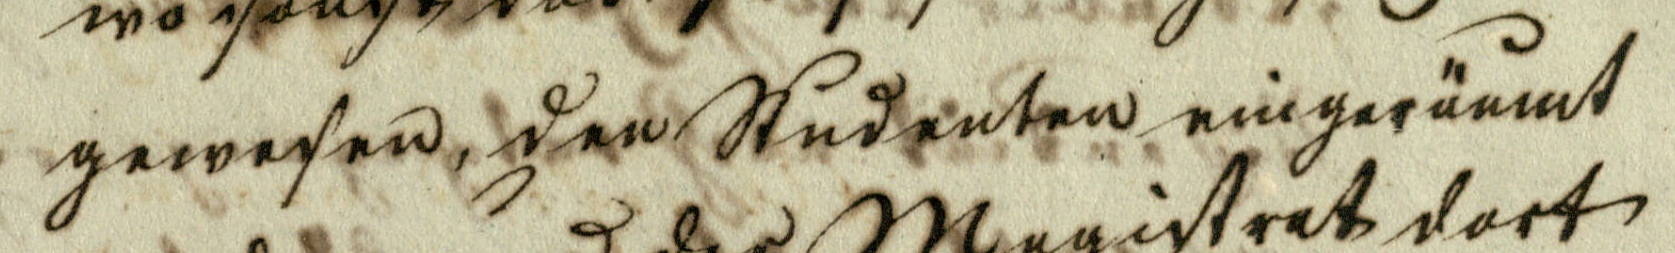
gewesen, den Studenten eingeräumt
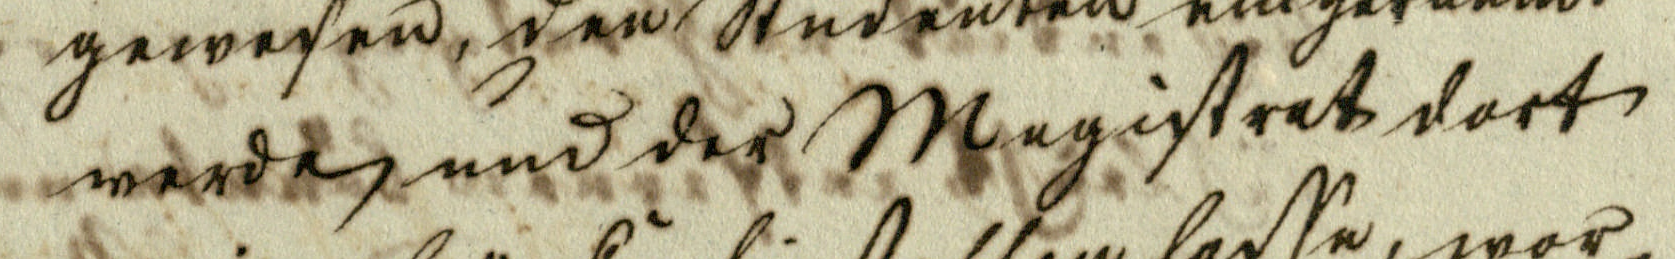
werde und der Magistrat dort
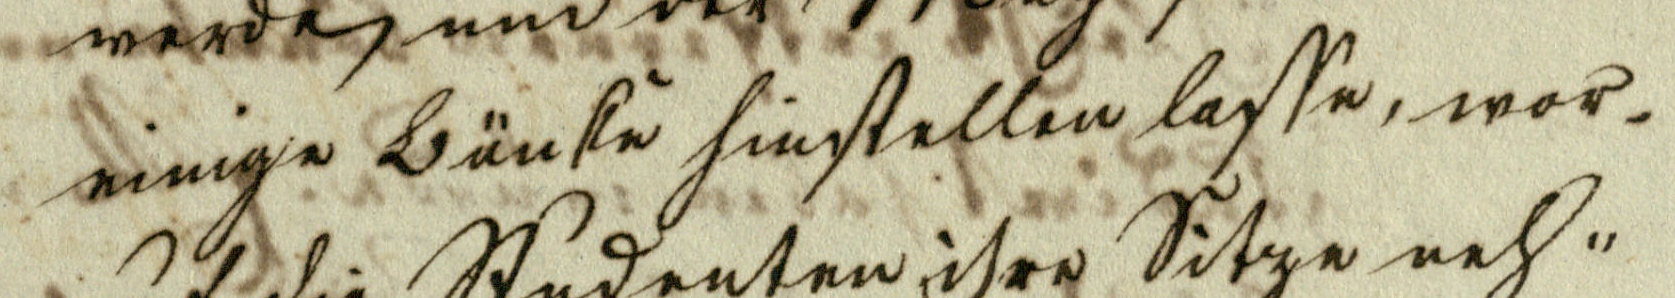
einige Bänke hinstellen lasse, wor¬
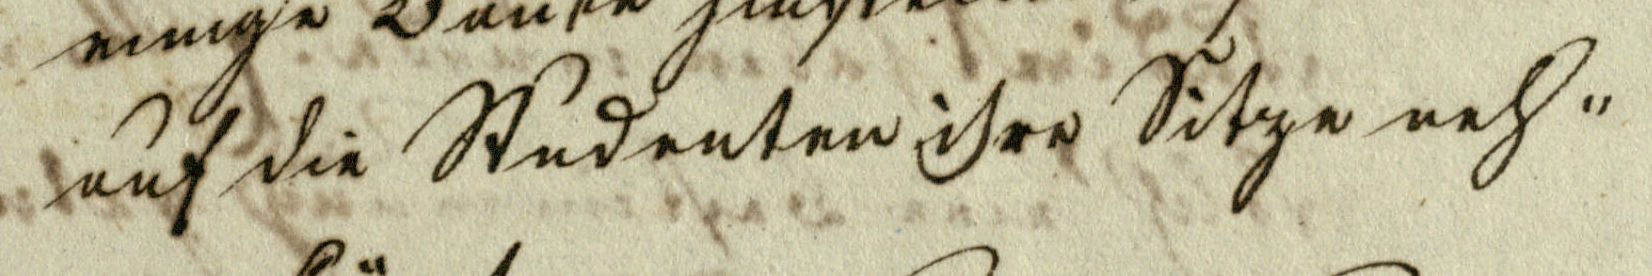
auf die Studenten ihre Sitze neh¬
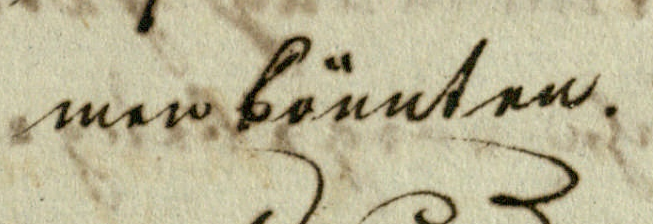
men könnten.
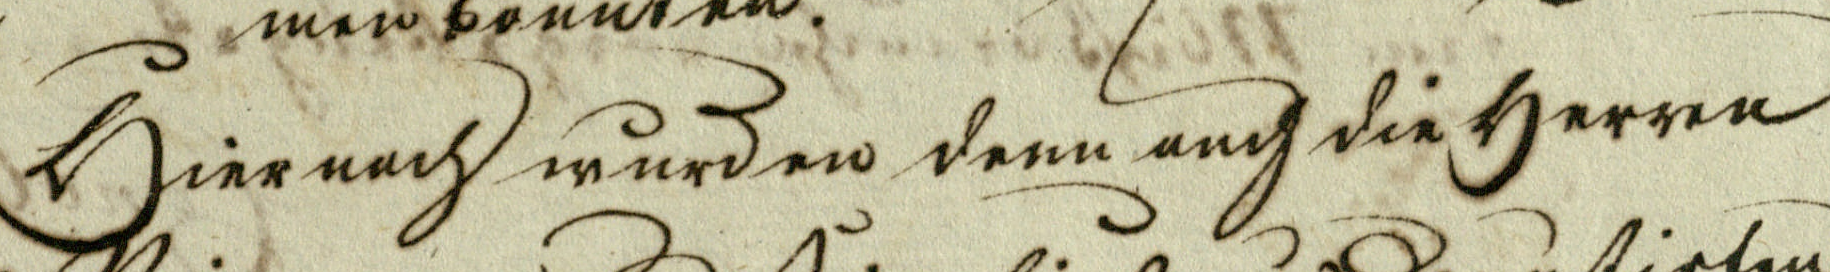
Hiernach wurden denn auch die Herren
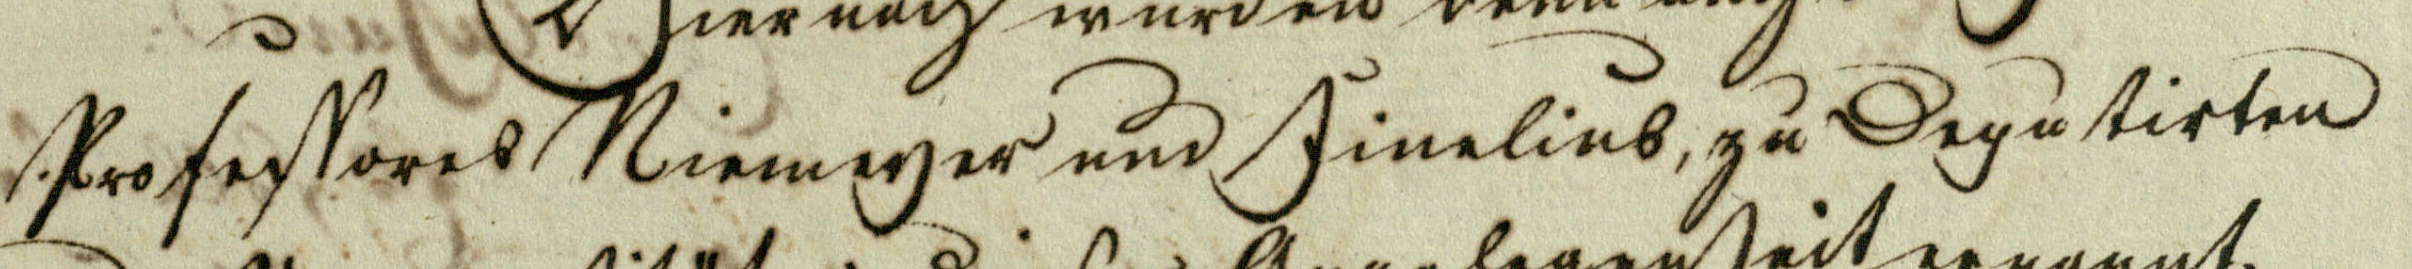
Professores Niemeyer und Finelius, zu Deputirten
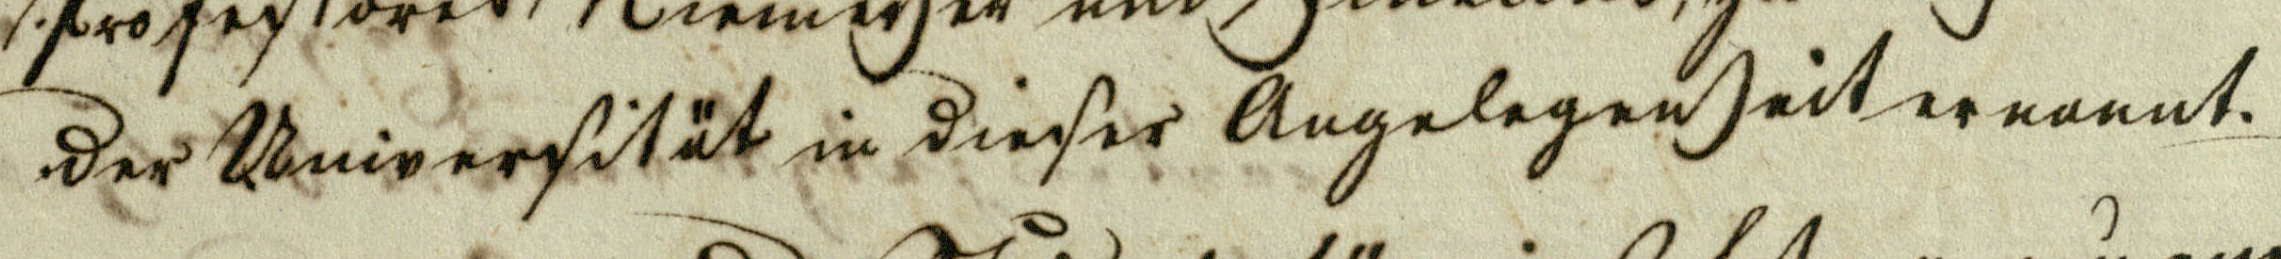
der Universität in dieser Angelegenheit ernannt.
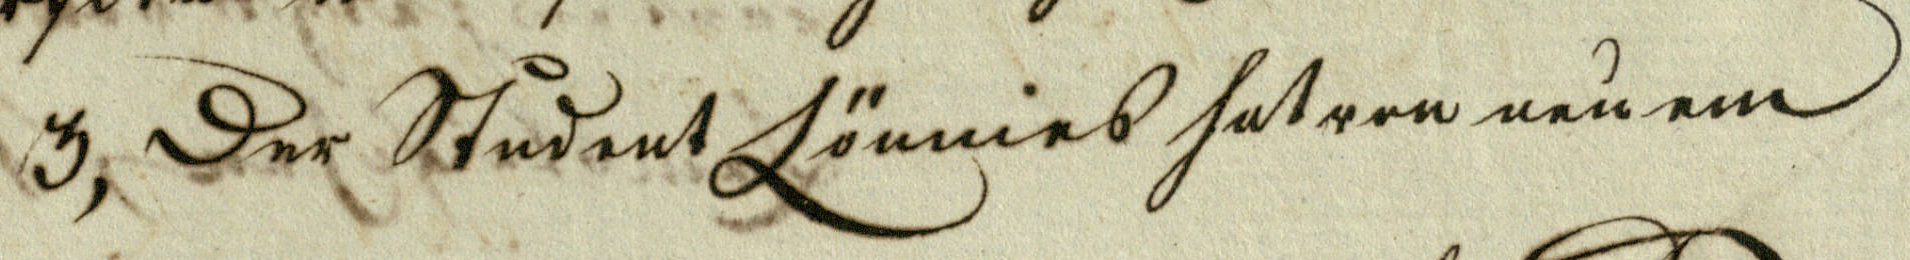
3, Der Student Lönnies hat von neuem
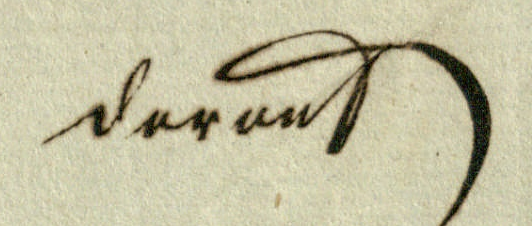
darauf
